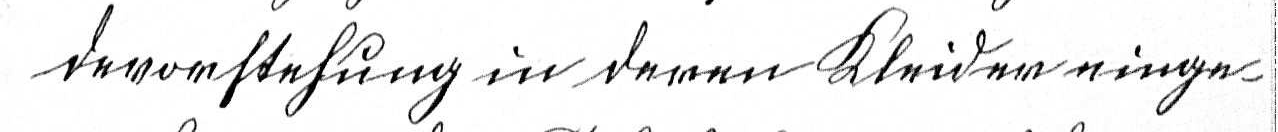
devorstehung in deren Kleider einge¬
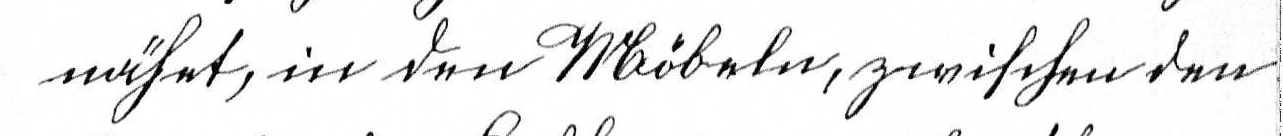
nähet, in den Möbeln, zwischen den
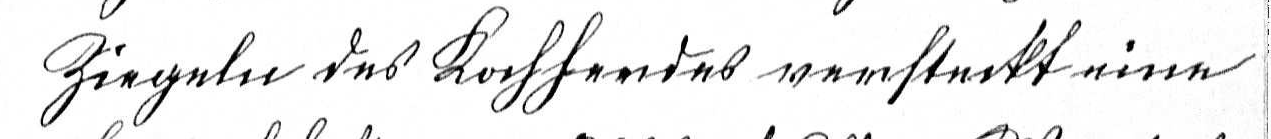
Ziegeln des Kochherdes versteckt eine
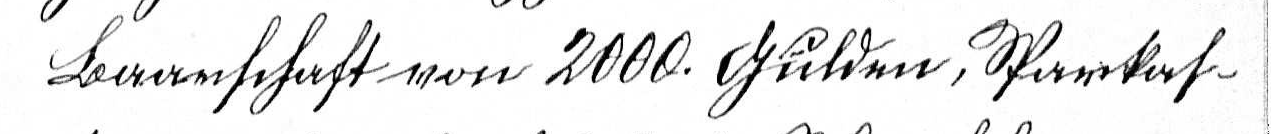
Baarschaft von 2000 Gulden, Sparkas¬
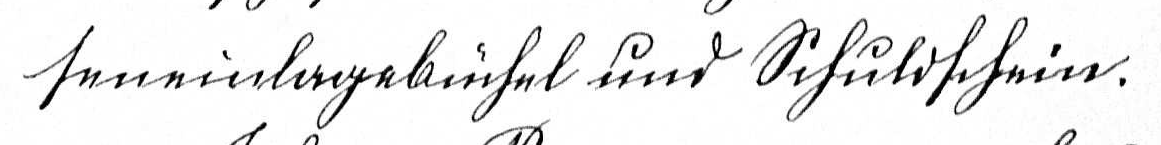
seneinlagebüchel und Schuldschein.
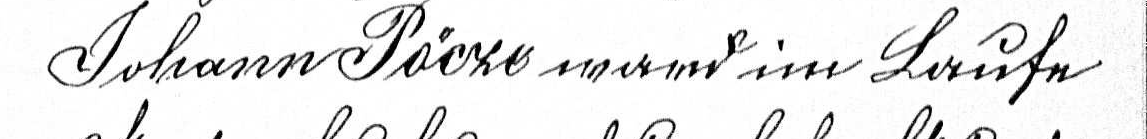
Johann Pöcze ward im Laufe
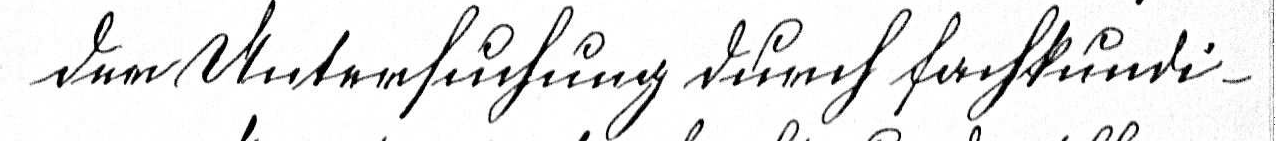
der Untersuchung durch fachkundi¬
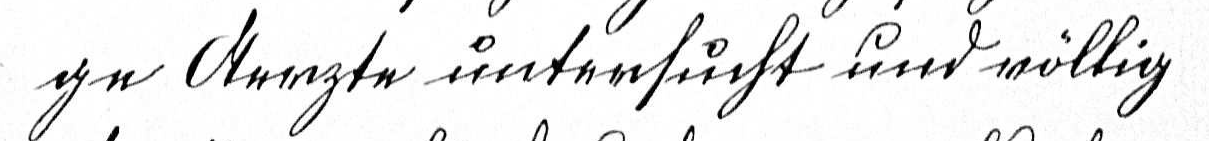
ge Aerzte untersucht und völlig
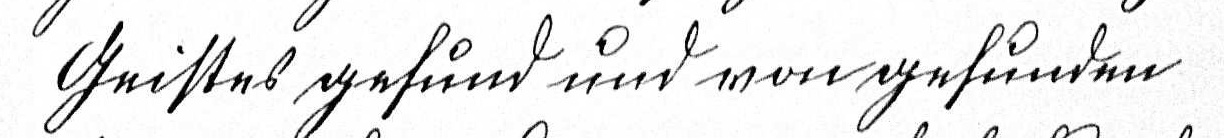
Geistes gesund und von gesunden
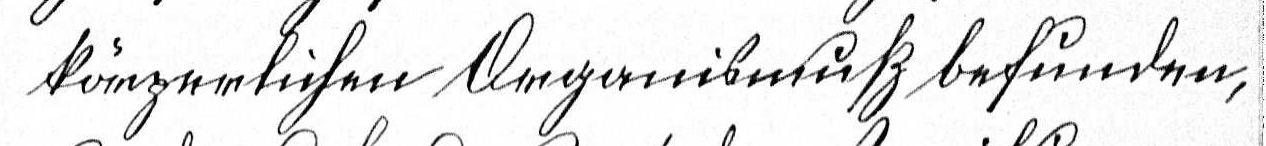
körperlichen Organismus befunden,
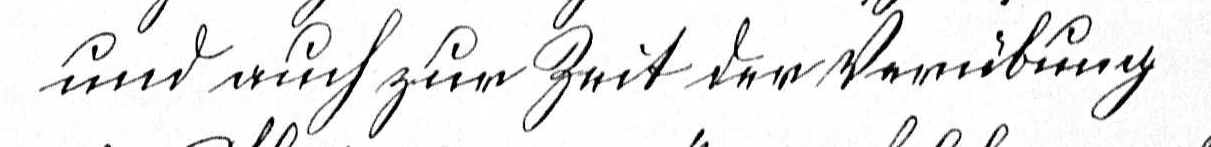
und auch zur Zeit der Verübung
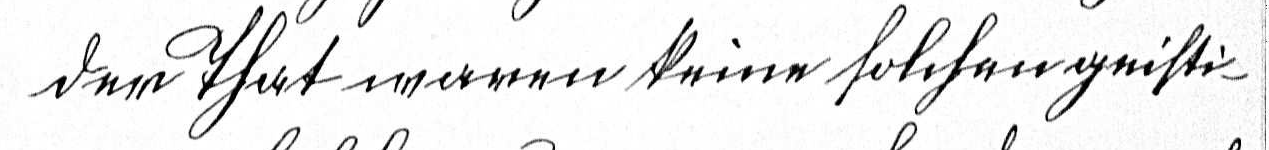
der That waren keine solchen geisti¬
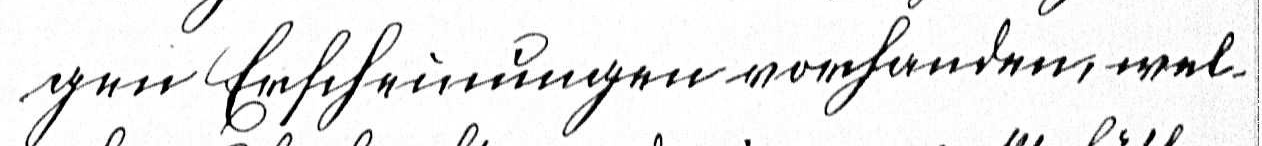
gen Erscheinungen vorhanden, wel¬
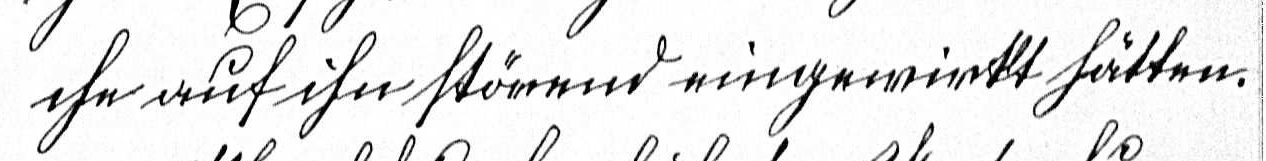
che auf ihn störend eingewirkt hätten.
